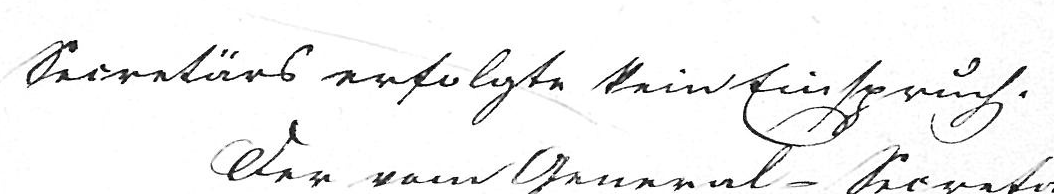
Secretärs erfolgte kein Einspruch.
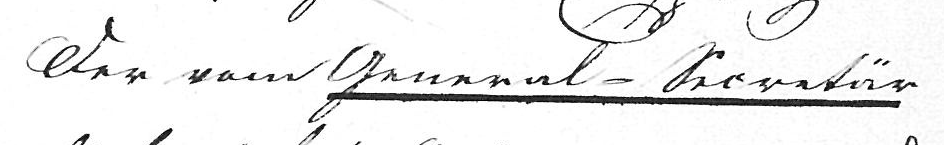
Der vom General-Secretär
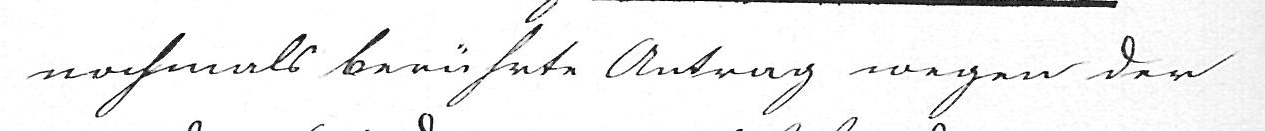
nochmals berührte Antrag wegen der
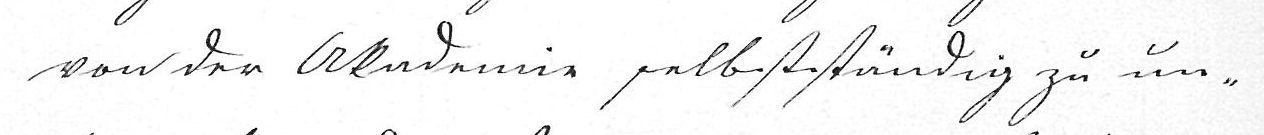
von der Akademie selbstständig zu un-
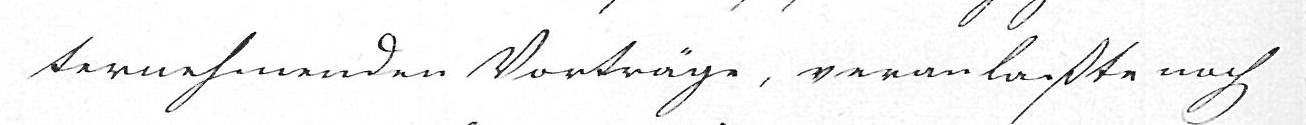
ternehmenden Vorträge, veranlaßte noch
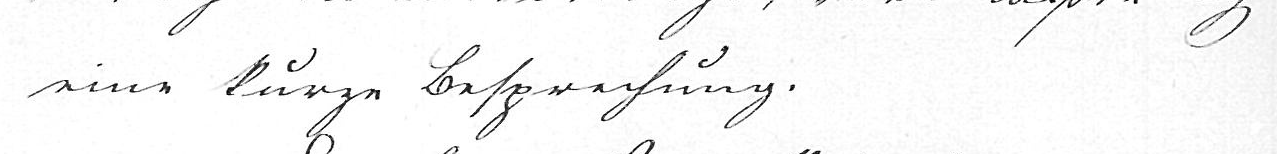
eine kurzen Besprechung.
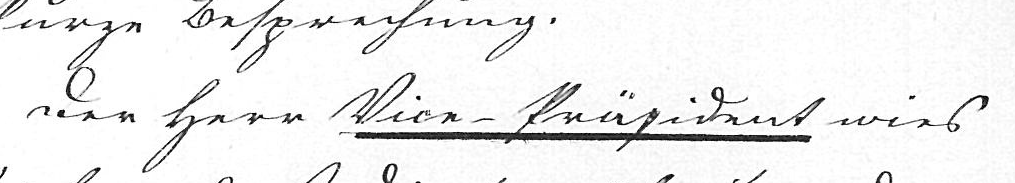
Der Herr Vice-Präsident wies
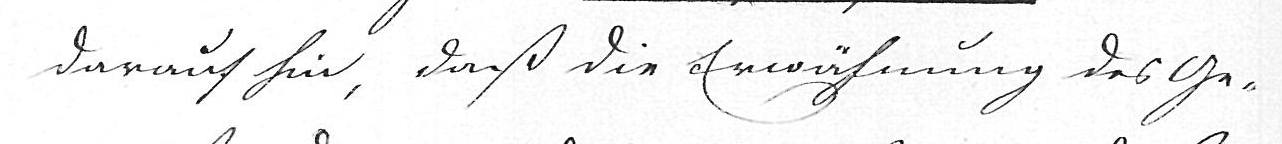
darauf hin, daß die Erwähnung des Ge-
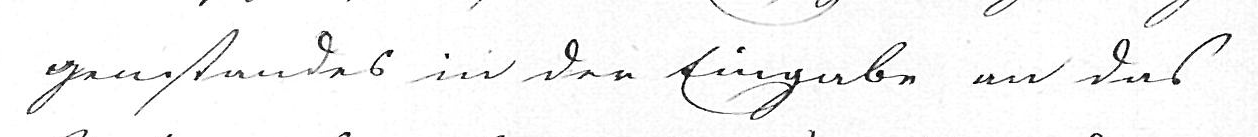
genstandes in der Eingabe an das
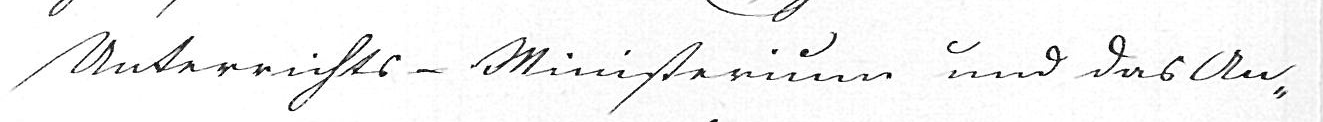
Unterrichts-Ministerium und das An-
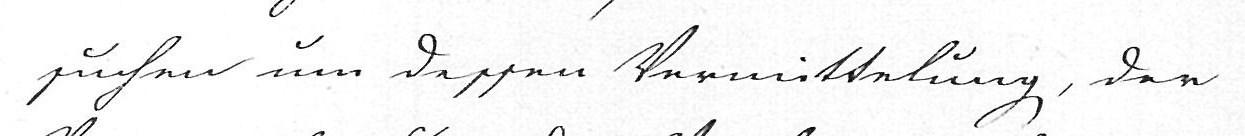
suchen um dessen Vermittelung, der
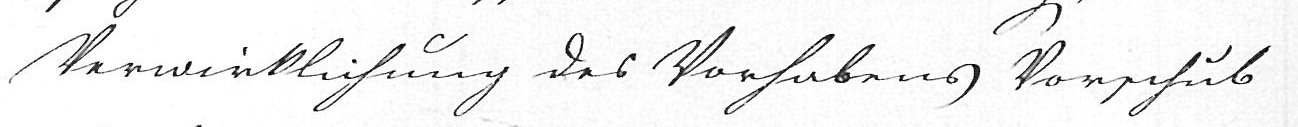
Verwirklichung des Vorhaben Vorschub
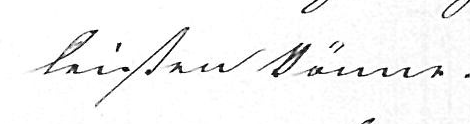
leisten könne.
